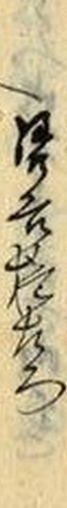渋谷権右衛門
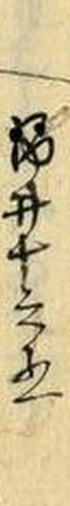酒井十之丞
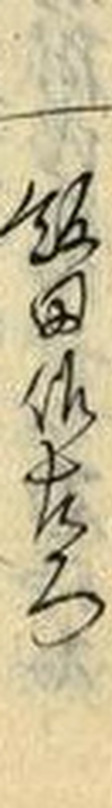飯田作左衛門
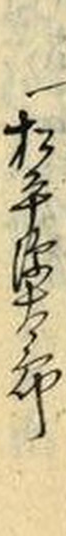松平源太郎
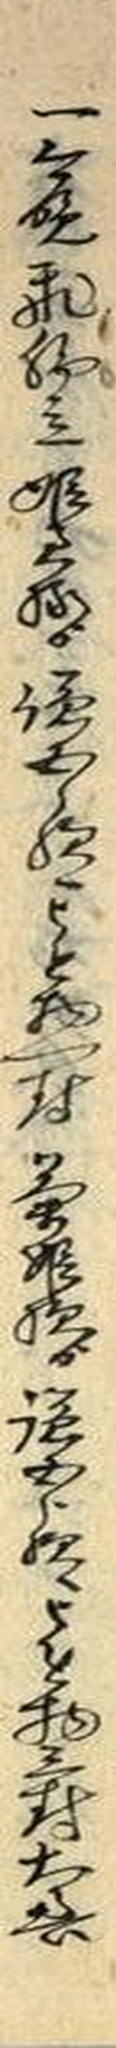一今暁飛脚立姫君様ゟ謙五郎様へ被進物一封菊姫様ゟ謙五郎様へ被進物三封大奥
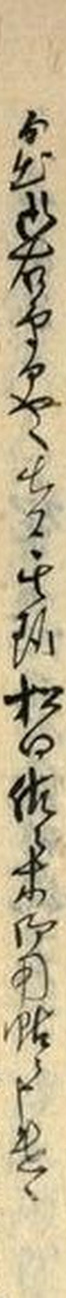ゟ出御右筆部やへ出ス其趣松田佐々木御用帖ニ申遣候
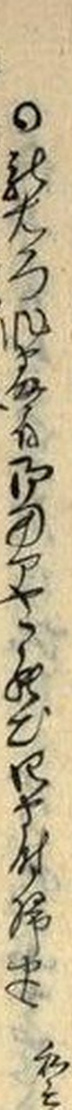〇新右衛門非番ニ付四時過御用部やへ罷出昼時前退出
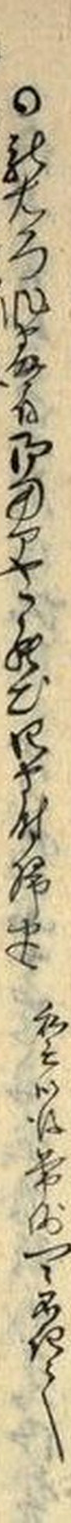〇新右衛門非番ニ付御用部やへ罷出四半時帰由私云以後常例一々不記之
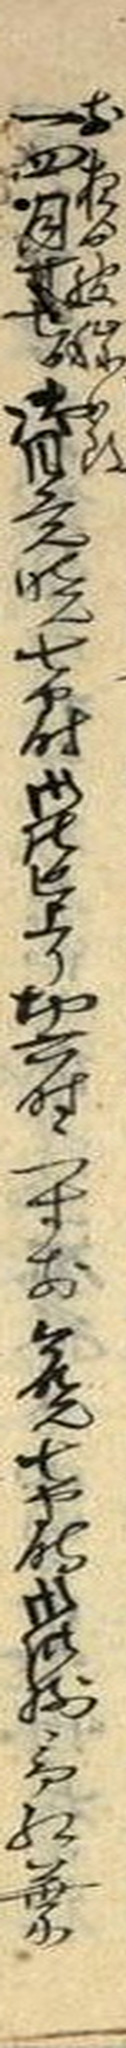一四月十七日御目覚暁七半時御仕廻上り切六時へ一寸前今晩七半時御供揃ニ而紅葉
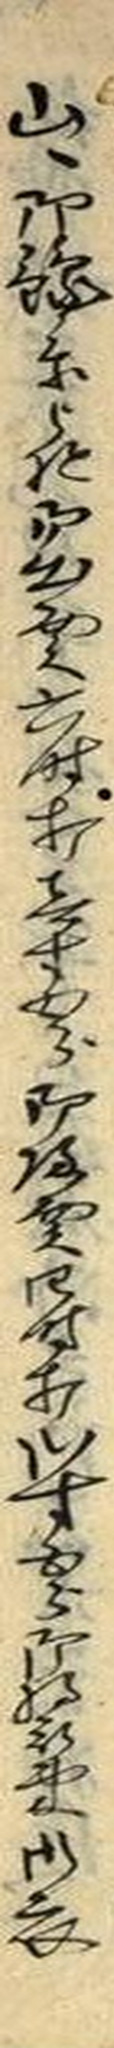山へ御予参被遊御出殿六時打壱寸五分御帰殿四時打弐寸五分御装束御衣

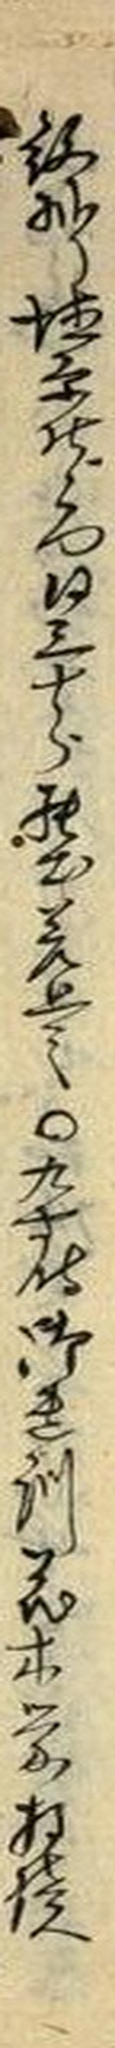紋掛埴原次郎右衛門同三十郎罷出差上之〇九半時御遺訓花木栄拝読
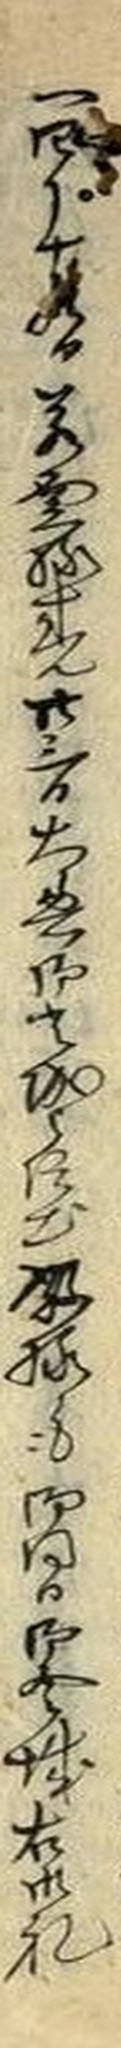一四月十八日若殿様来ル廿三日大奥御登城被仰出殿様ニも御同日御登城右御礼
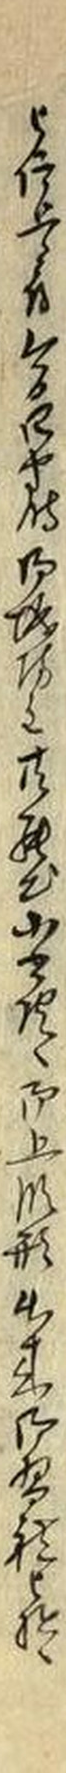被仰上候ニ付今日四半時御城坊主共罷出小書院へ御上段形出来御習礼被遊候
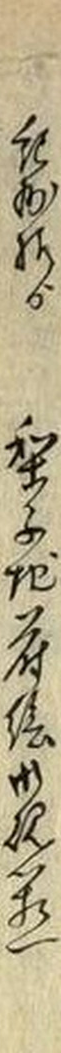紀州様ゟ梨子地蒔絵御硯箱一
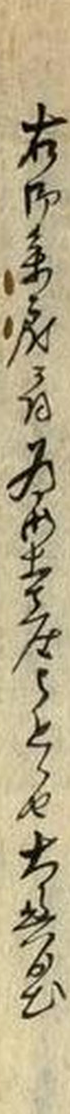右御参府ニ付為御土産被進候由大奥ゟ出
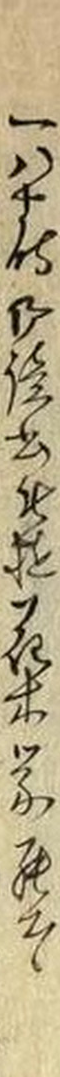一八半時読書被遊花木栄罷出候
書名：少傅日録抄（斉承付側向頭取日記、在府）
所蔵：福井県文書館 Fukui Prefectural Archives
